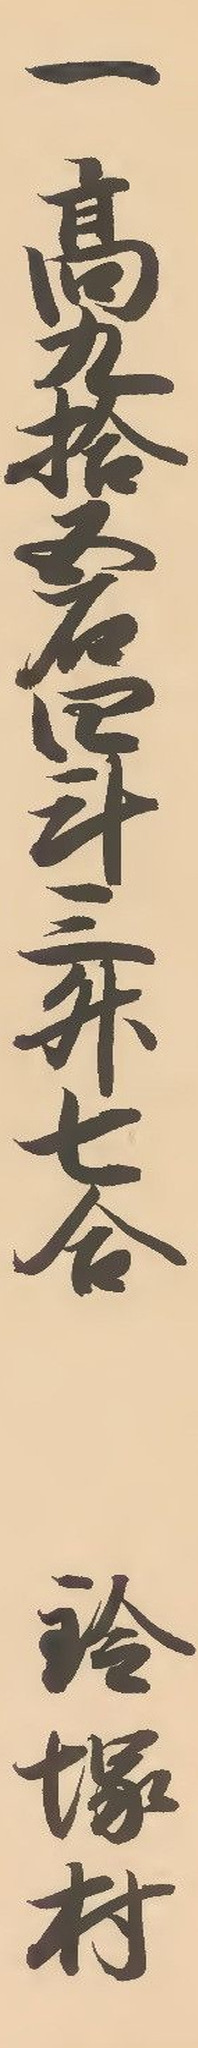一高九拾五石四斗三升七合鈴塚村
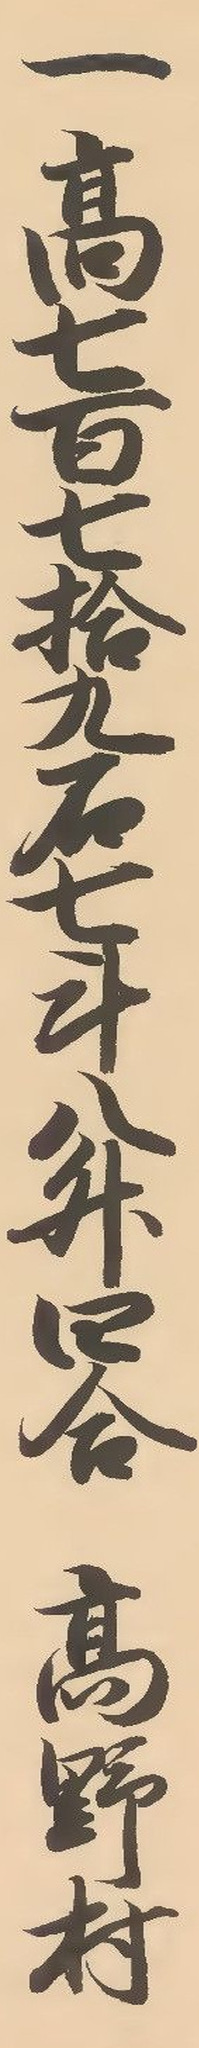一高七百七拾九石七斗八升四合高野村
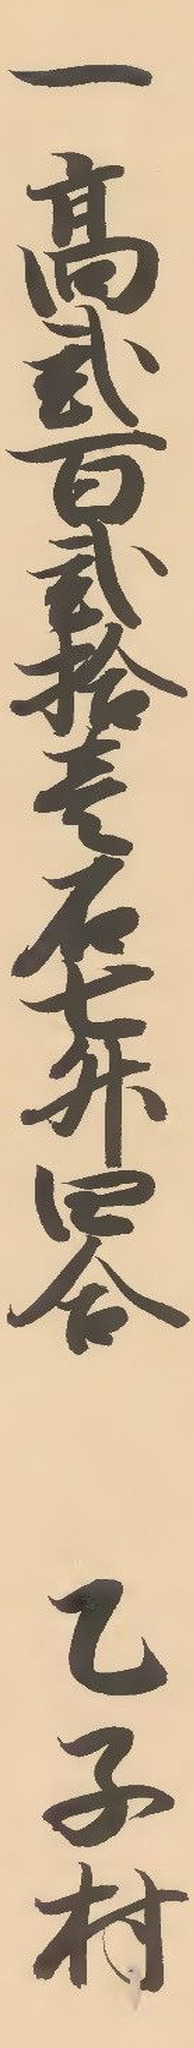一高弐百弐拾壱石七升四合乙子村
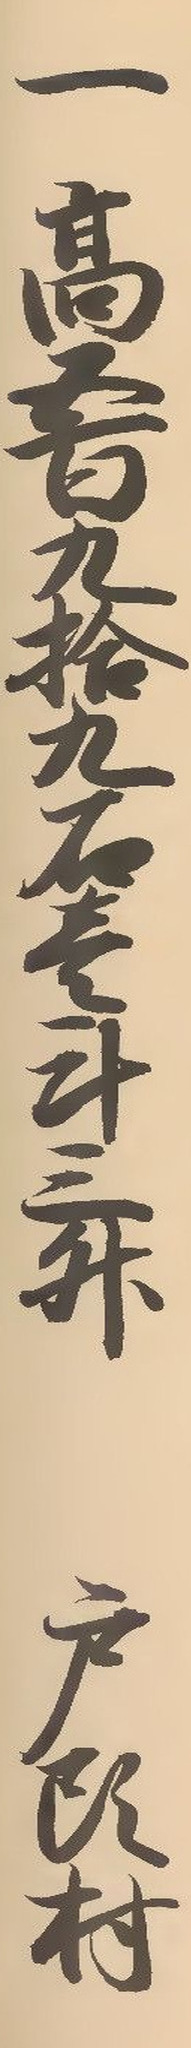一高五百九拾九石壱斗三升戸頭村
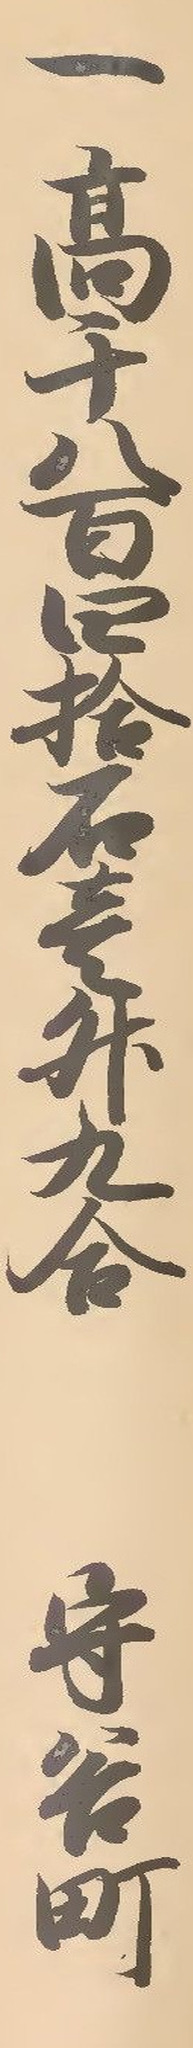一高千八百四拾石壱升九合守谷町
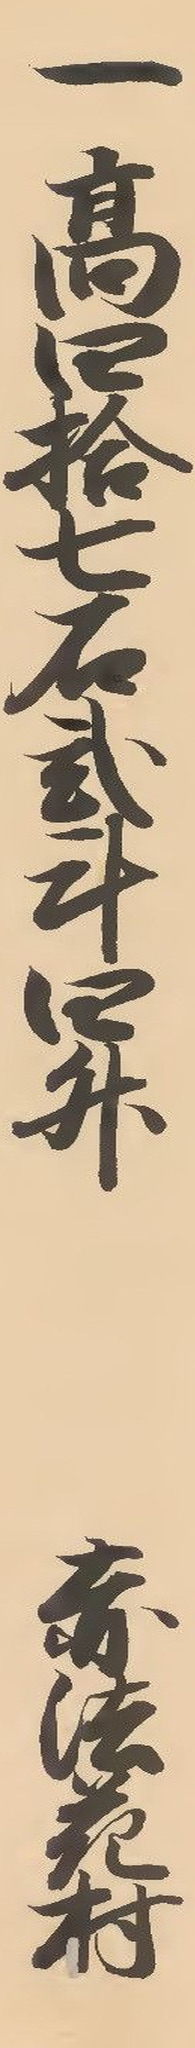一高四拾七石弐斗四升赤法花村
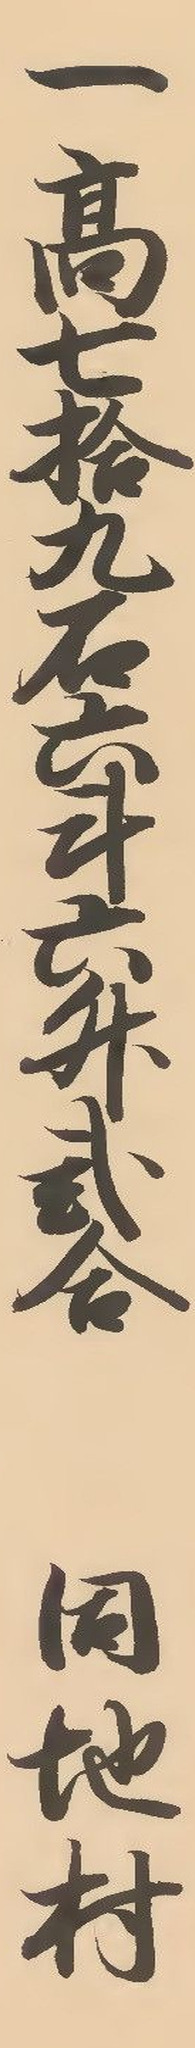一高七拾九石六斗六升弐合同地村
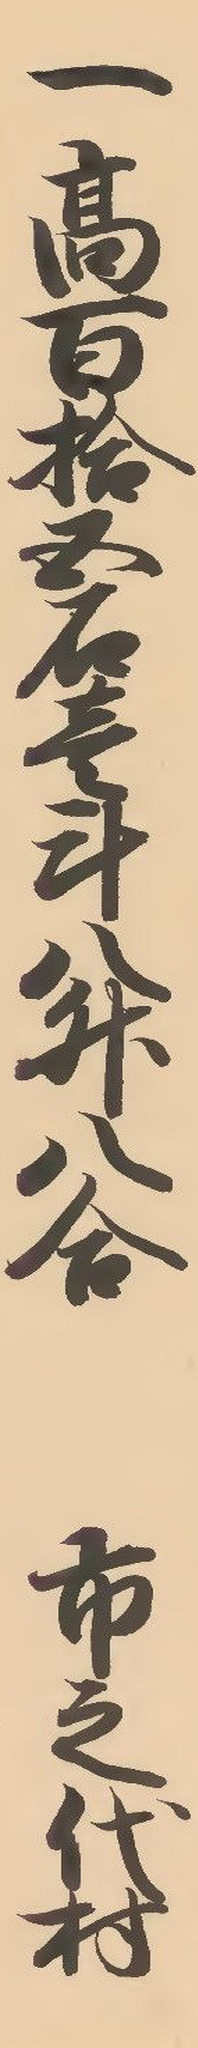一高百拾五石壱斗八升八合市之代村

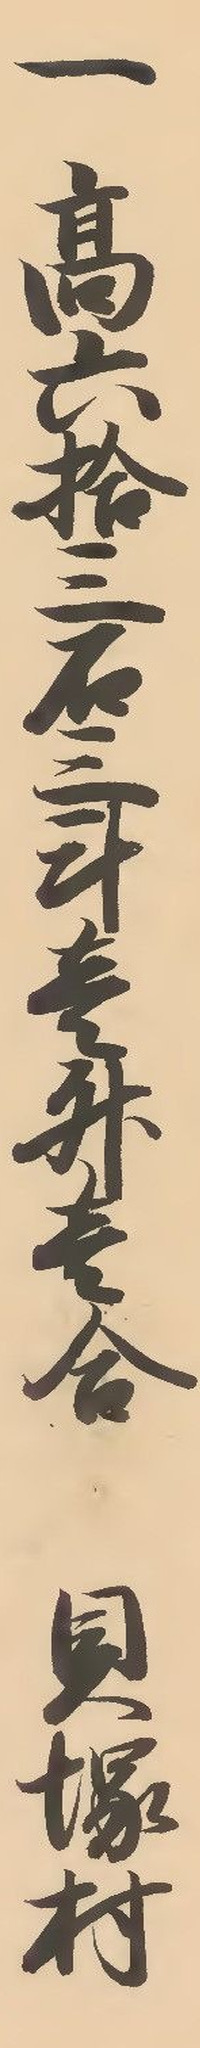一高六拾三石三斗壱升壱合貝塚村
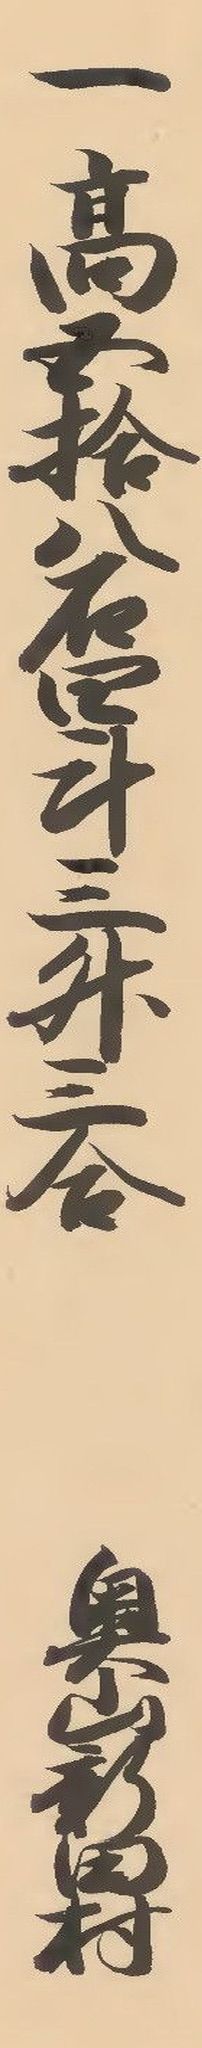一高五拾八石四斗三升三合奥山新田村
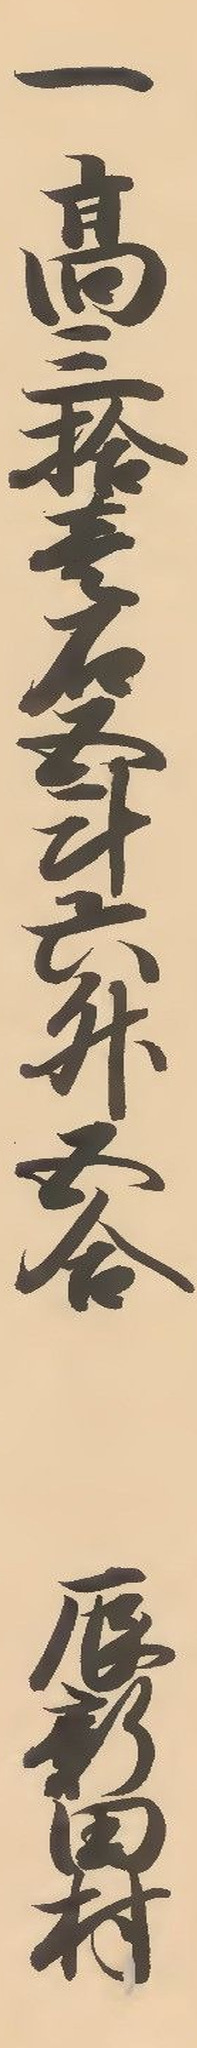一高三拾壱石五斗六升五合辰新田村
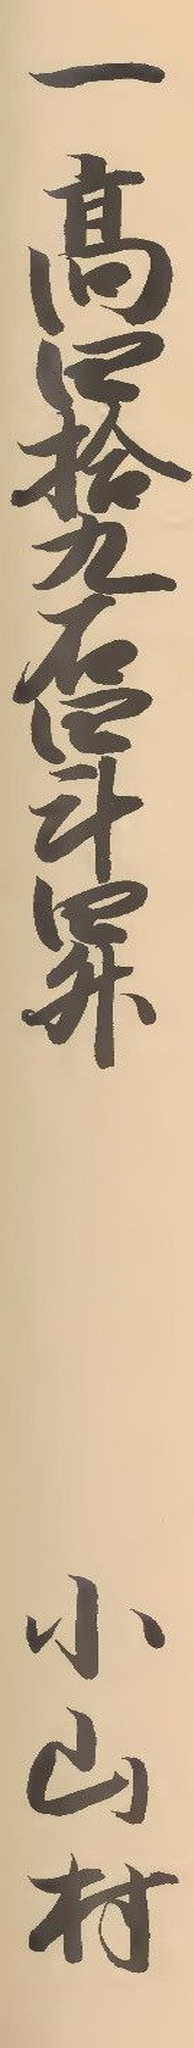一高四拾九石四斗四升小山村
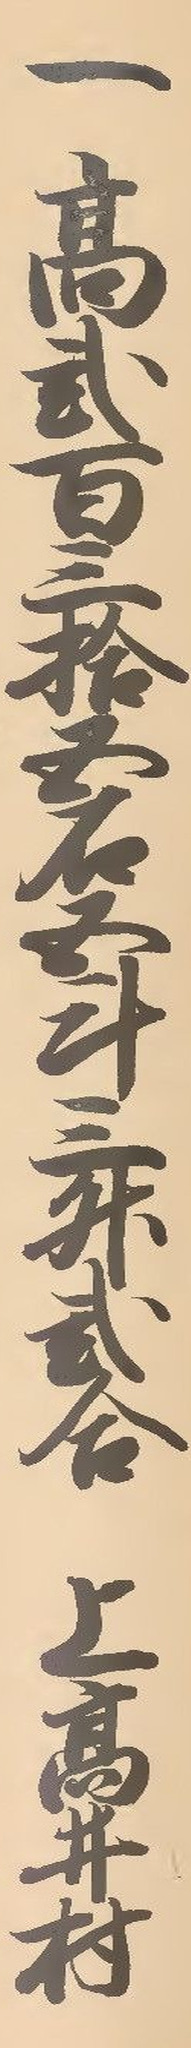一高弐百三拾五石五斗三升弐合上高井村
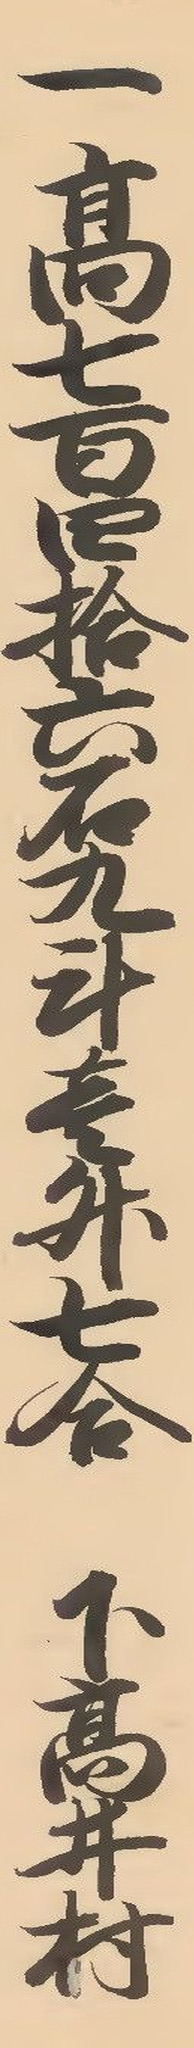一高七百四拾六石九斗壱升七合下高井村
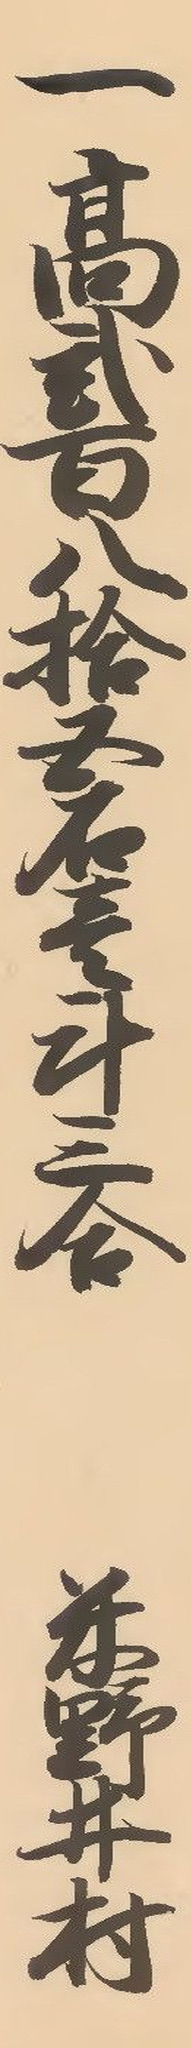一高弐百八拾五石壱斗三合米野井村
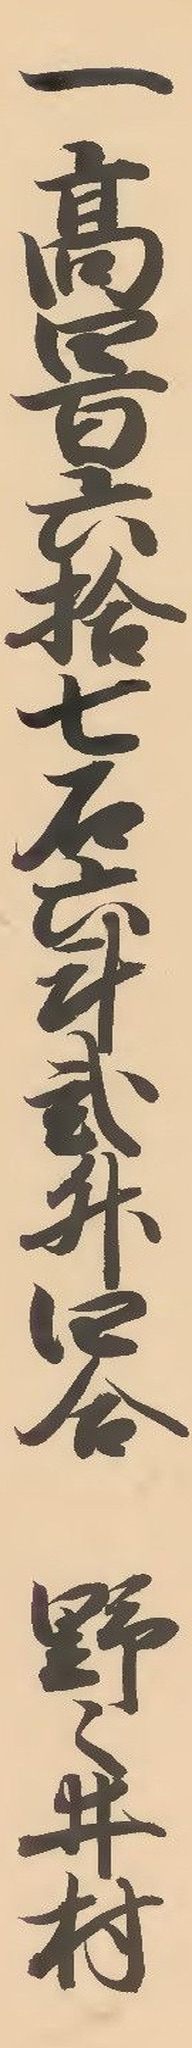一高四百六拾七石六斗弐升四合野々井村
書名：下総国郷帳
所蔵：国立公文書館 National Archives of Japan
